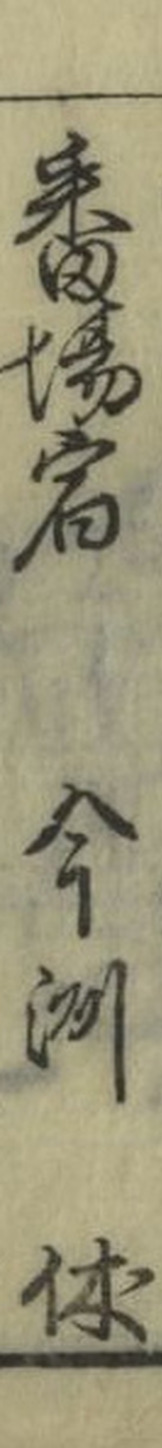番場宿今洲休
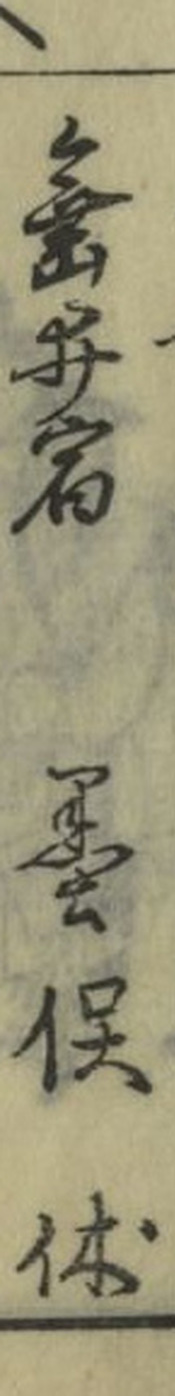垂井宿墨俣休
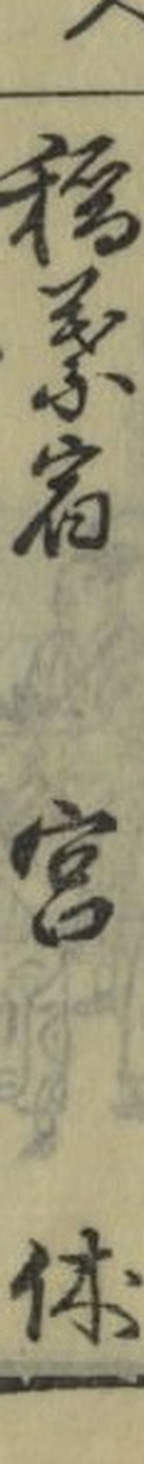稲葉宿宮休
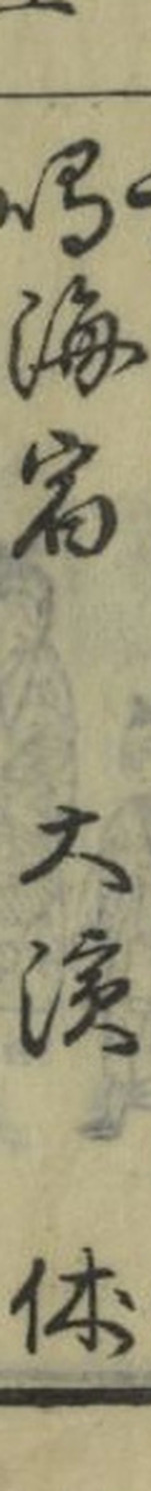鳴海宿大濱休
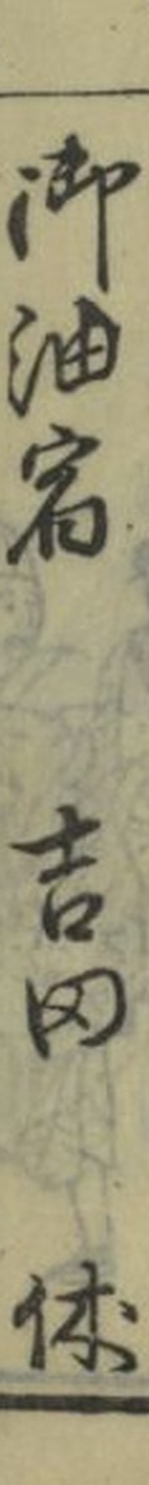御油宿吉田休
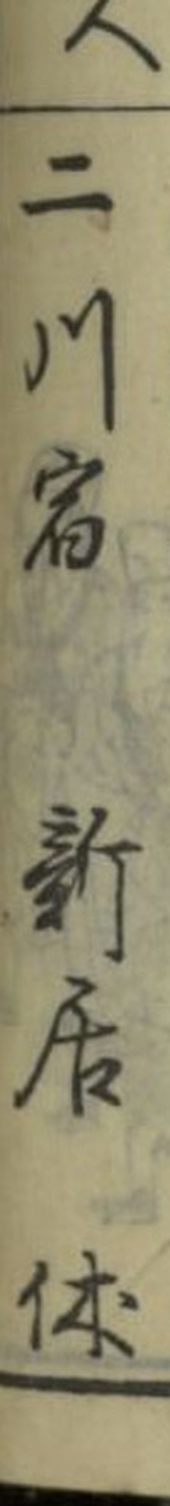二川宿新居休
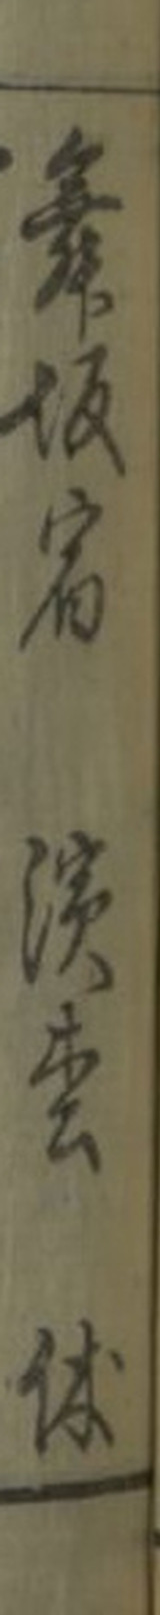舞坂宿濱松休
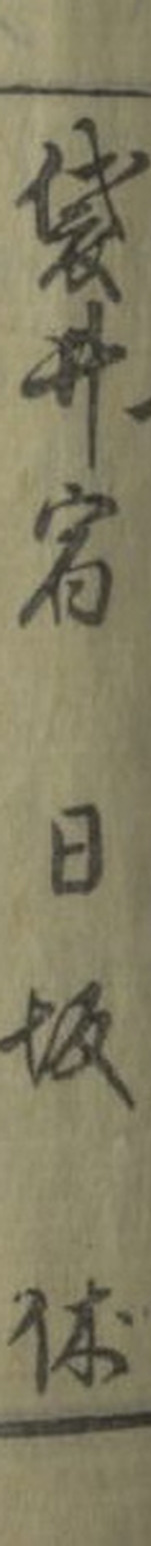袋井宿日坂休
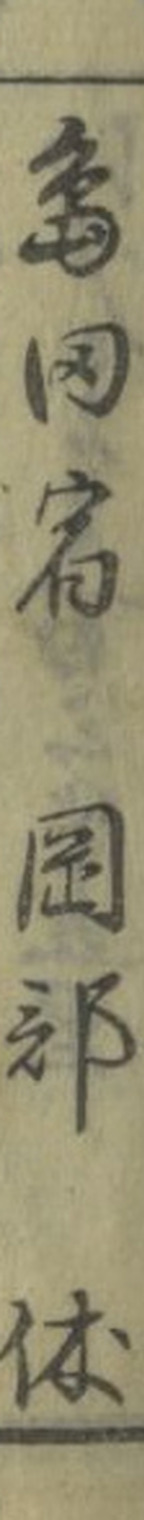島田宿岡部休
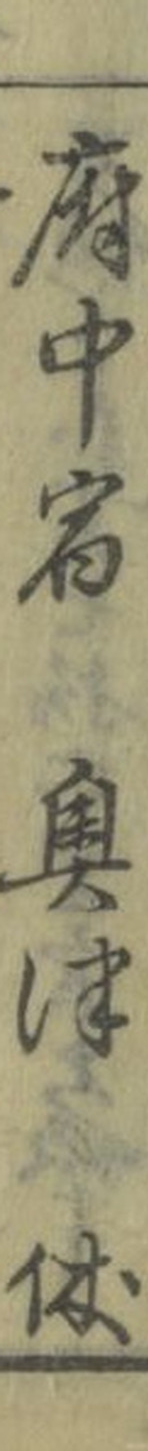府中宿奥津休
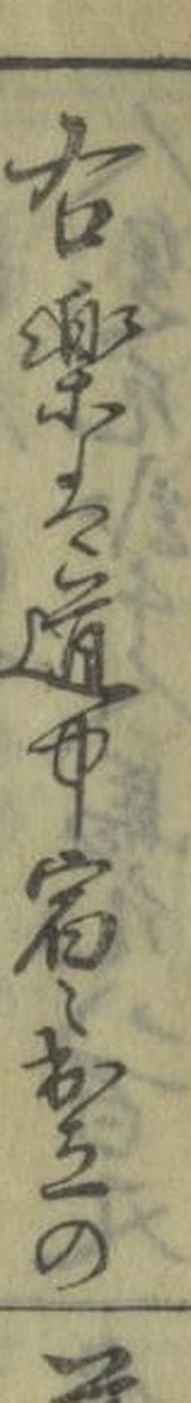右楽は道中宿々出立の
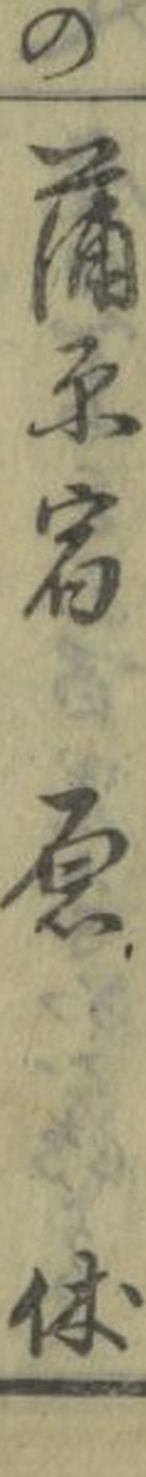蒲原宿原休
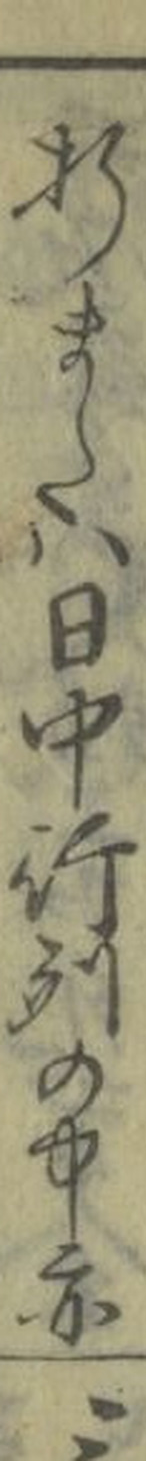折または日中行列の中亦
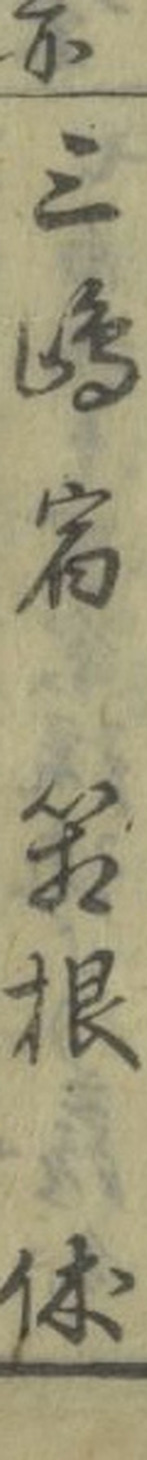三嶋宿箱根休
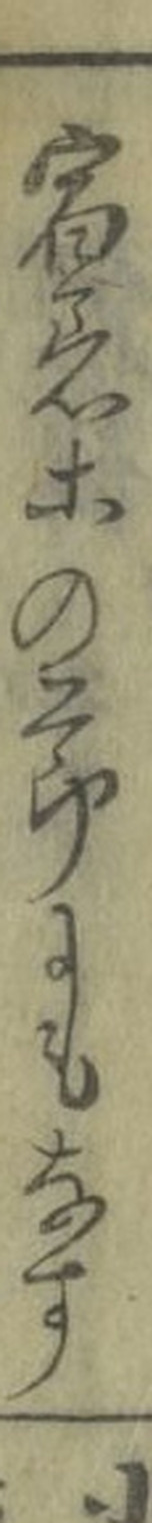宿着等の節にもなす
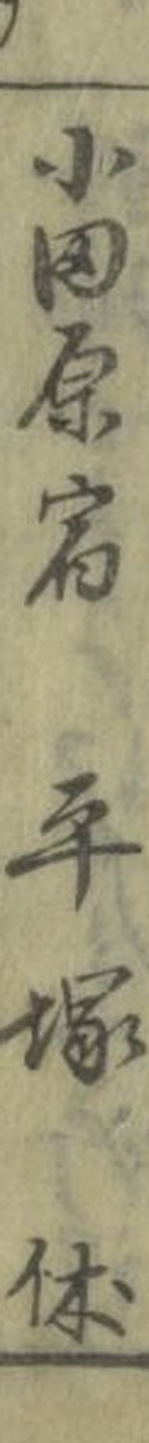小田原宿平塚休
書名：琉球人行列記
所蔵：University of the Ryukyus Library
